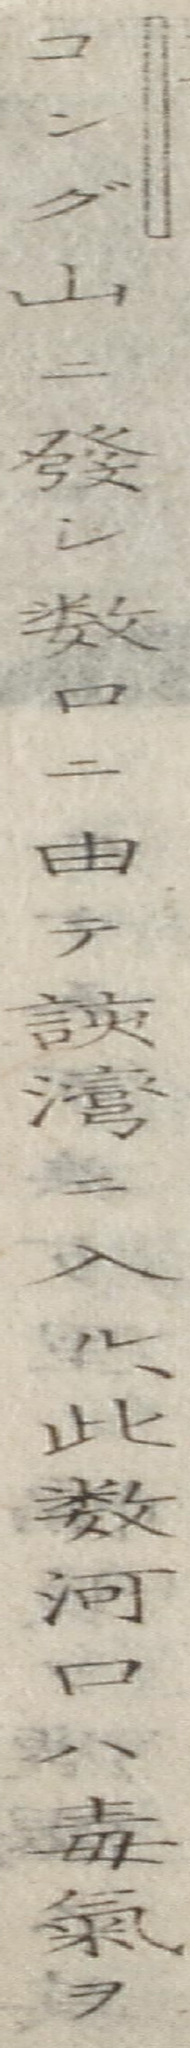コング山ニ発シ数口ニ由テ詼湾ニ入ル、此数河口ハ毒気ヲ
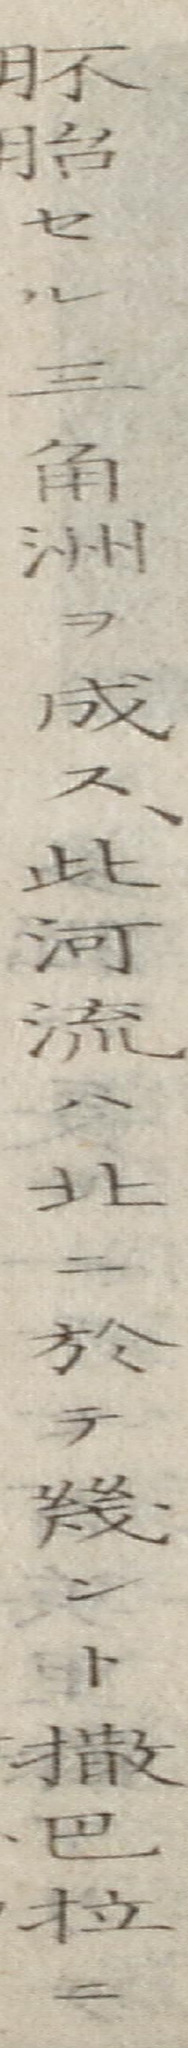胚胎セル三角洲ヲ成ス、此河流ハ北ニ於テ幾ント撤巴拉ニ
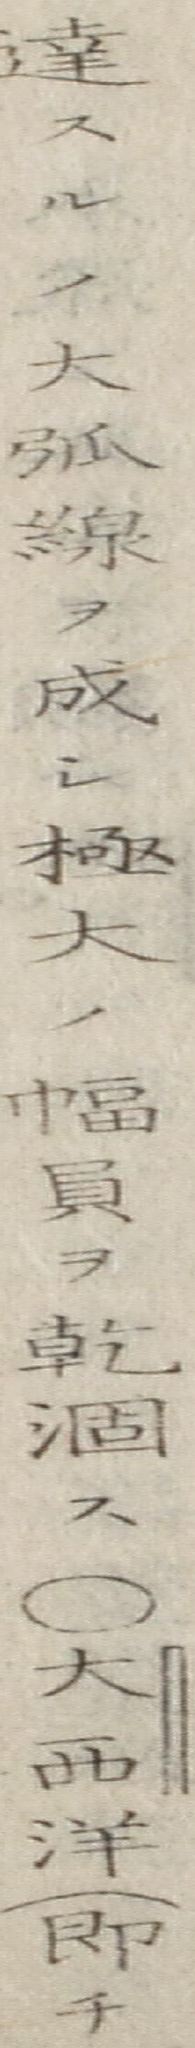達スルノ大弧線ヲ成シ極大ノ幅員ヲ乾涸ス○大西洋（即チ
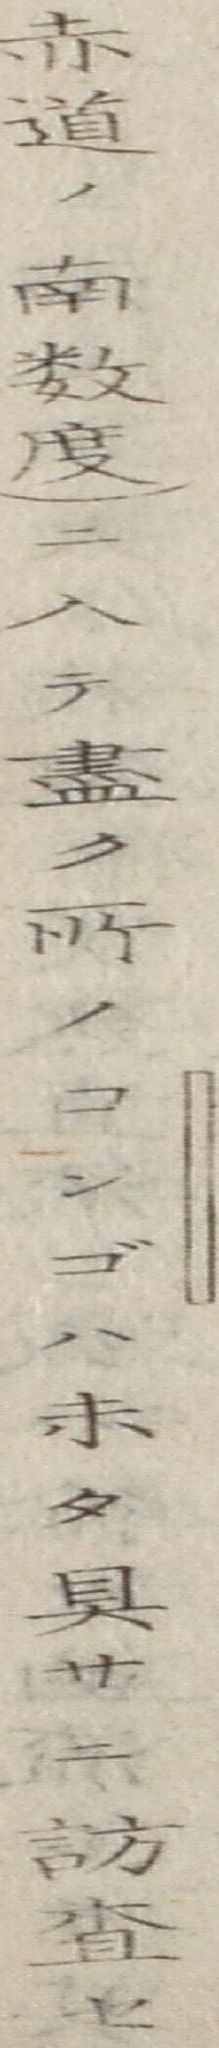赤道ノ南数度）ニ入テ尽ク所ノコンゴハ未タ具サニ訪査セ
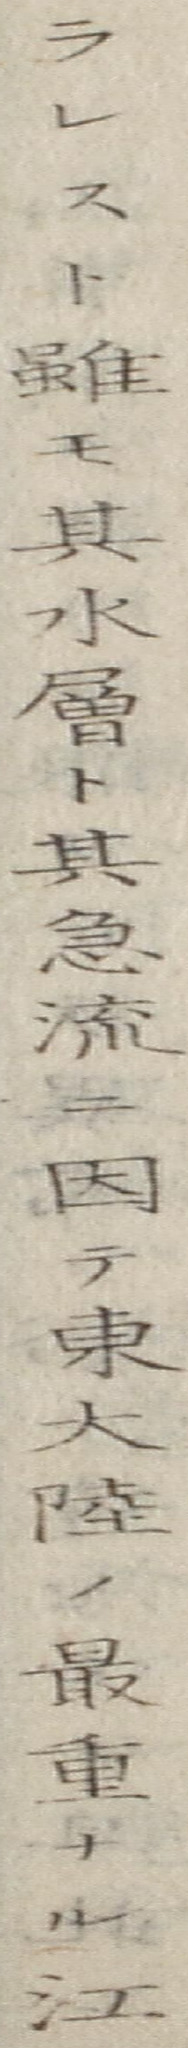ラレスト雖モ其水層ト其急流ニ因テ東大陸ノ最重ナル江
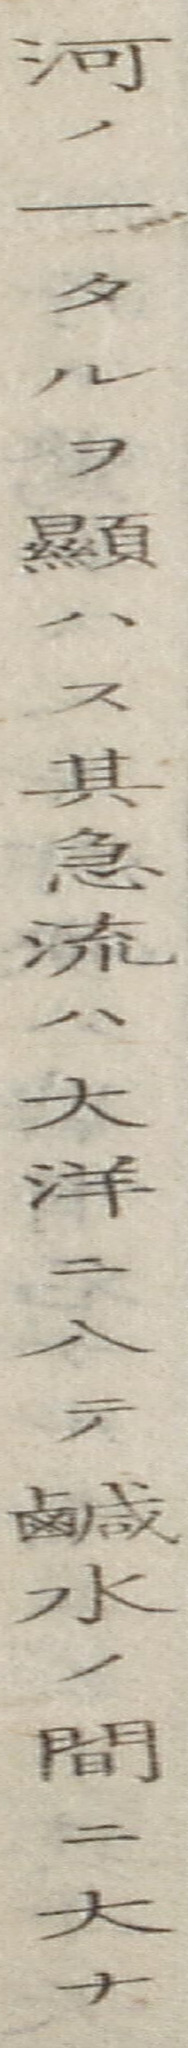河ノ一タルヲ顕ハス其急流ハ大洋ニ入テ鹸水ノ間ニ大ナ
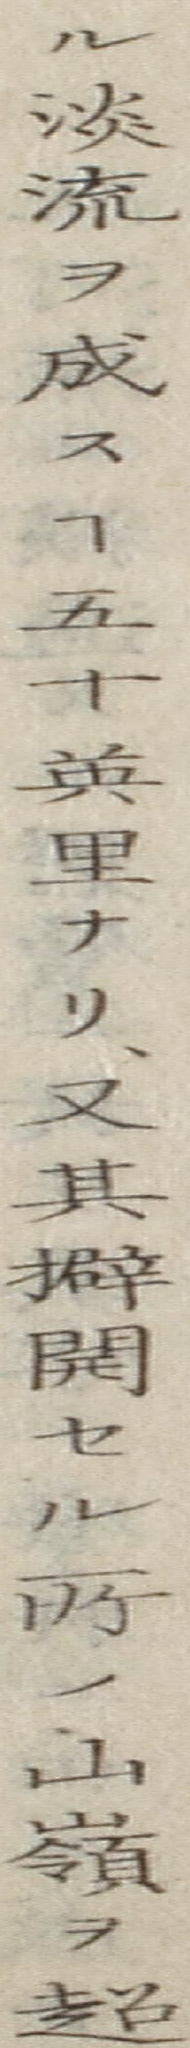ル淡流ヲ成スヿ五十英里ナリ、又其抵開セル所ノ山嶺ヲ超
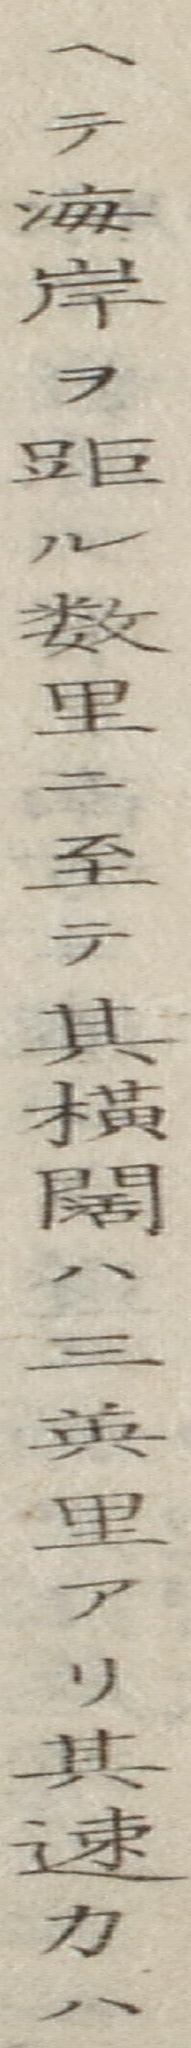ヘテ海岸ヲ距ル数里ニ至テ其横闊ハ三英里アリ其速力ハ
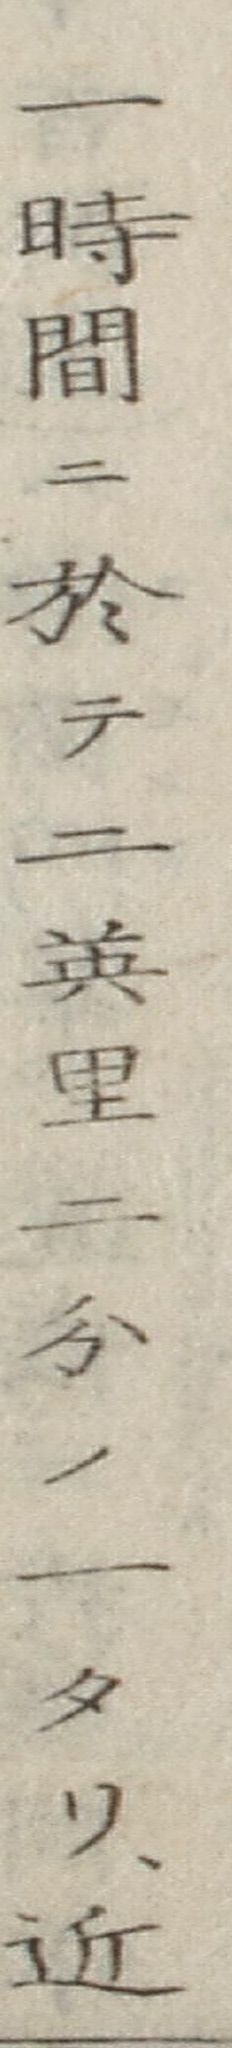一時間ニ於テ二英里二分ノ一タリ、近
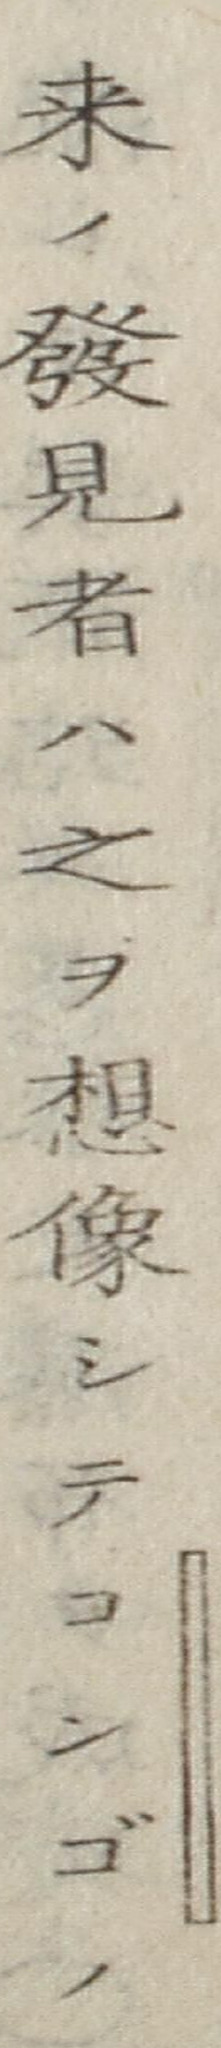来ノ発見者ハ之ヲ想像シテコンゴノ
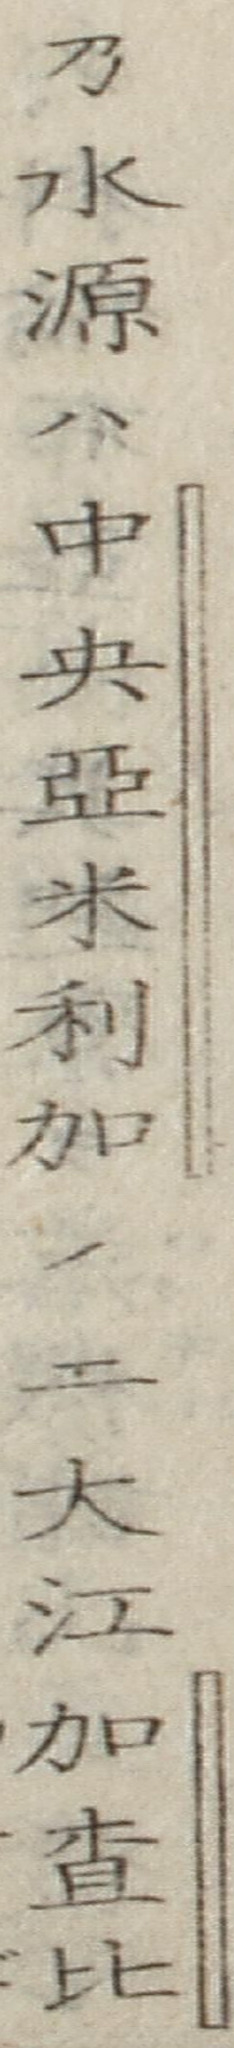水源ハ中央亜米利加ノ二大江加査比
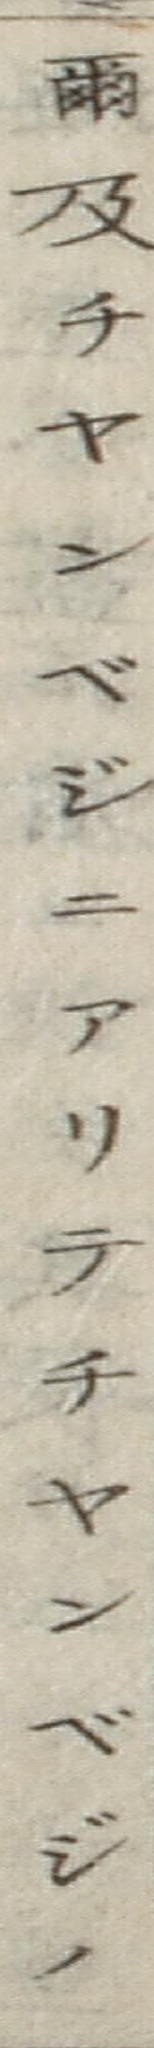及チヤンベジニアリテチヤンベジノ
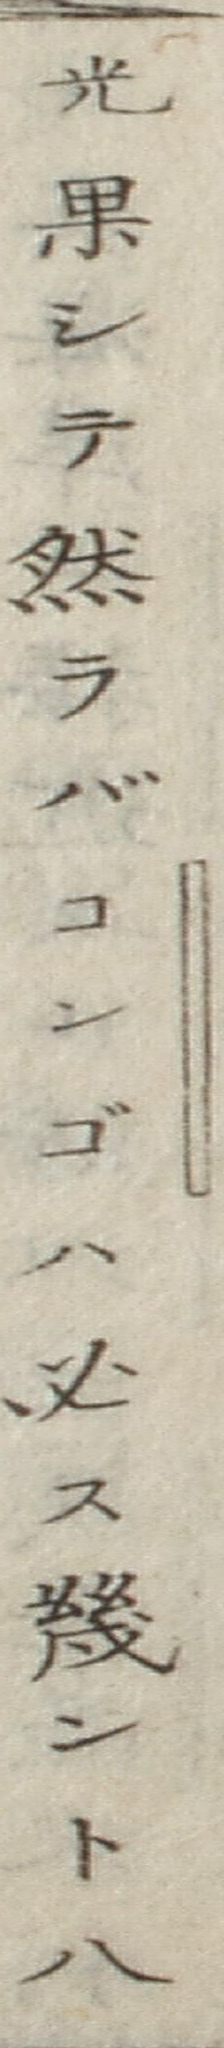果シテ然ラバコンゴハ必ス幾ント八
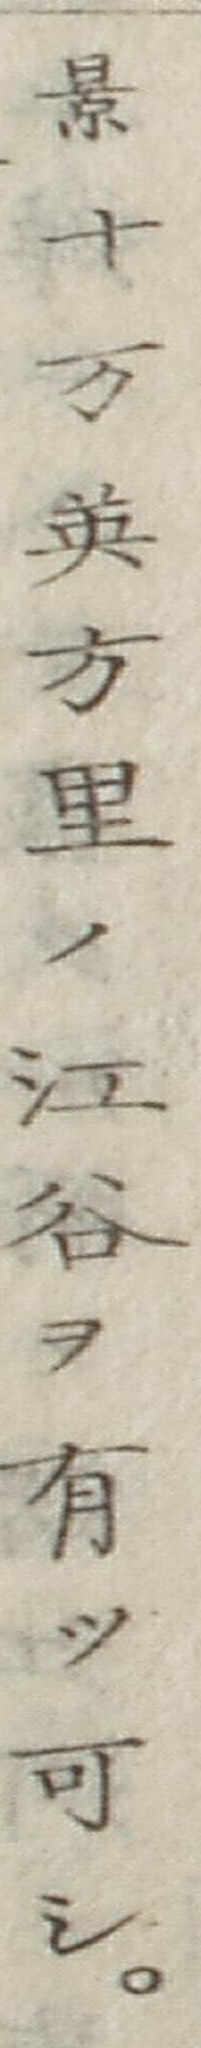十万英方里ノ江谷ヲ有ツ可シ。
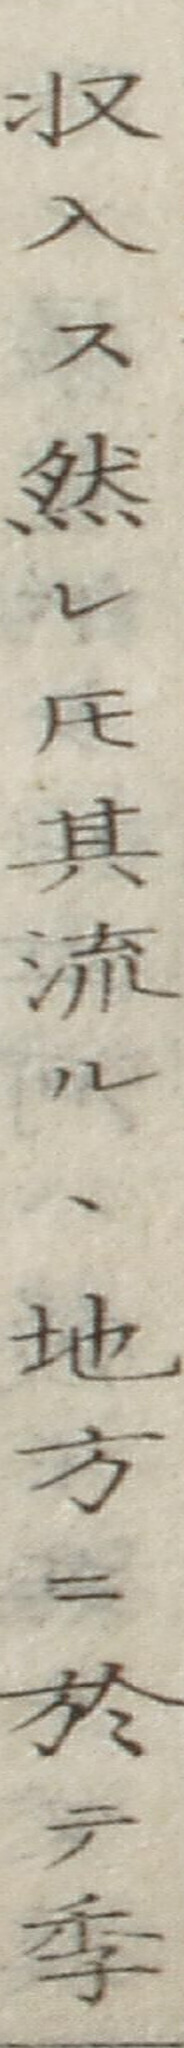収入ス然レトモ其流ルヽ地方ニ於テ季
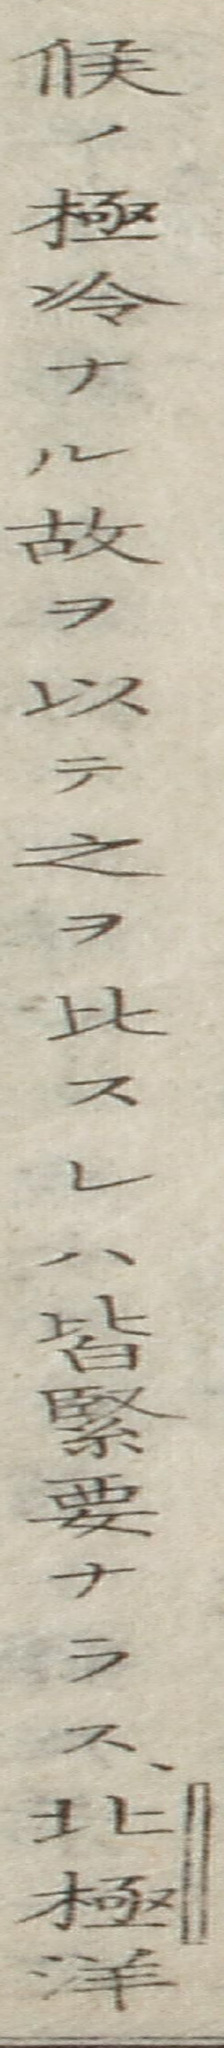候ノ極冷ナル故ヲ以テ之ヲ比スレハ皆緊要ナラス、北極洋
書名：地形論　巻二
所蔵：東京大学地震研究所図書室 Earthquake Research Institute Library, The University of Tokyo, JAPAN
